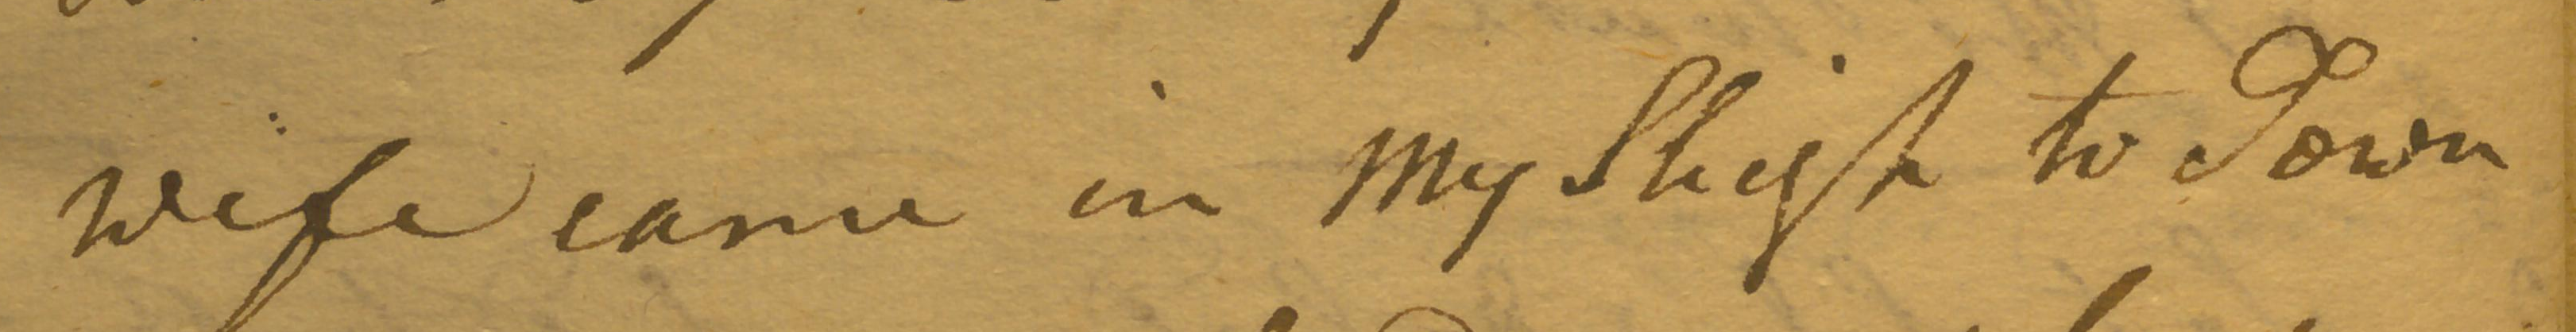wife came in My Sleigh to Town
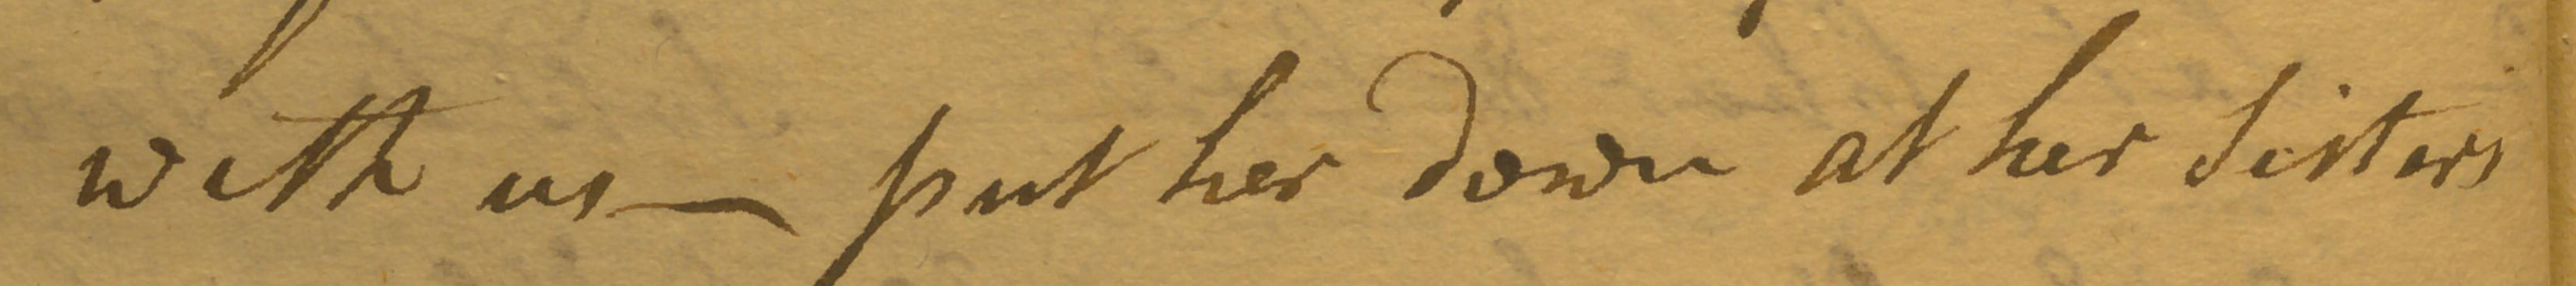with us- put her down at her Sisters
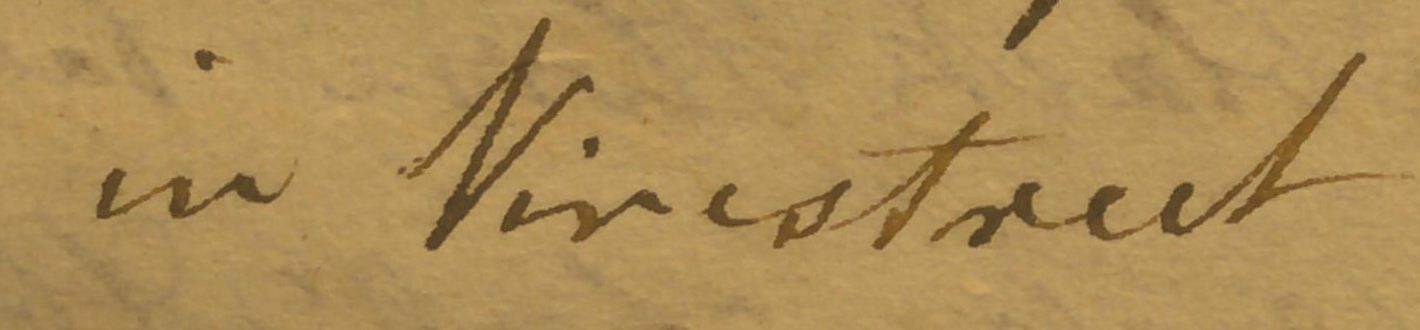in Vine street
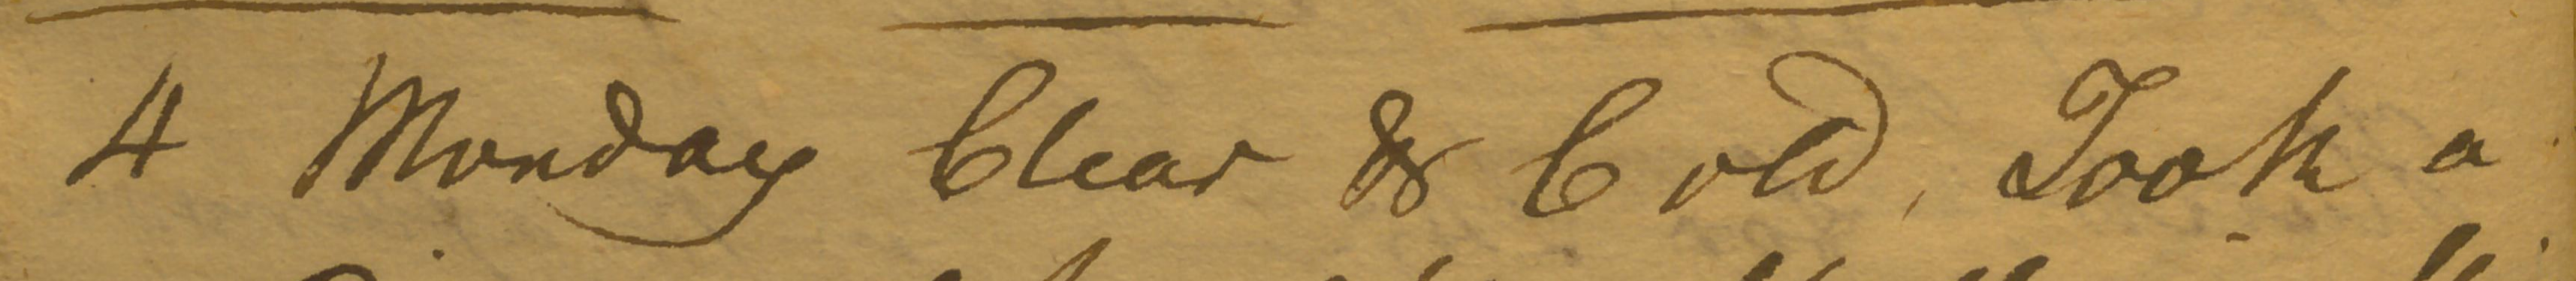4 Monday Clear & Cold. Took a
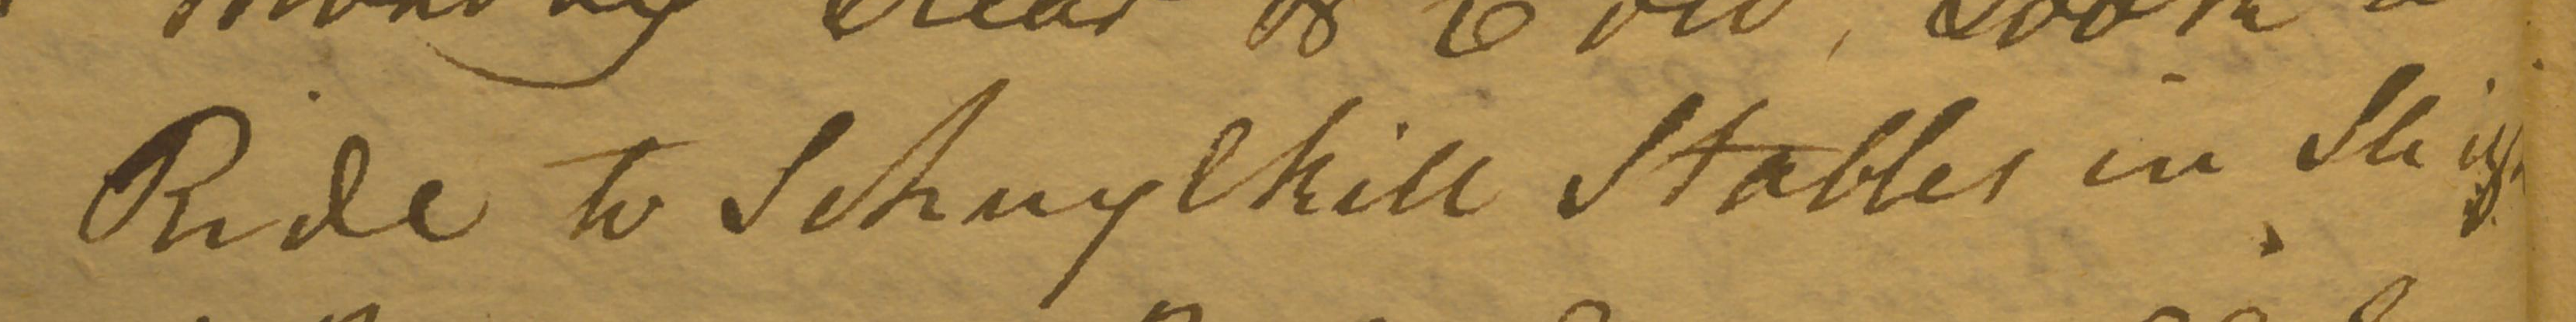Ride to Schuylkill Stables in Sleigh
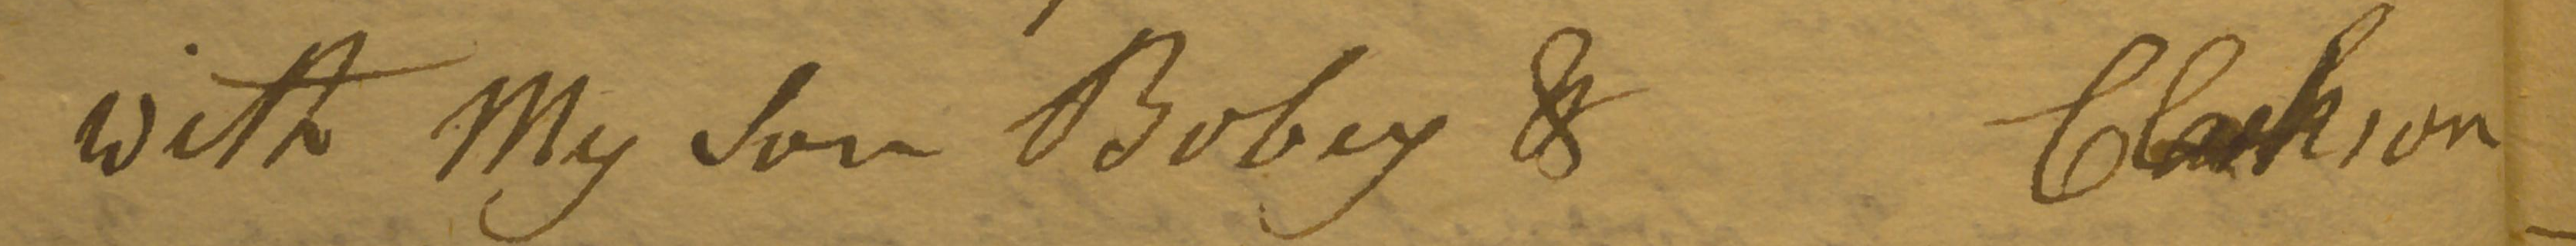with My Son Bobey & Clarkson
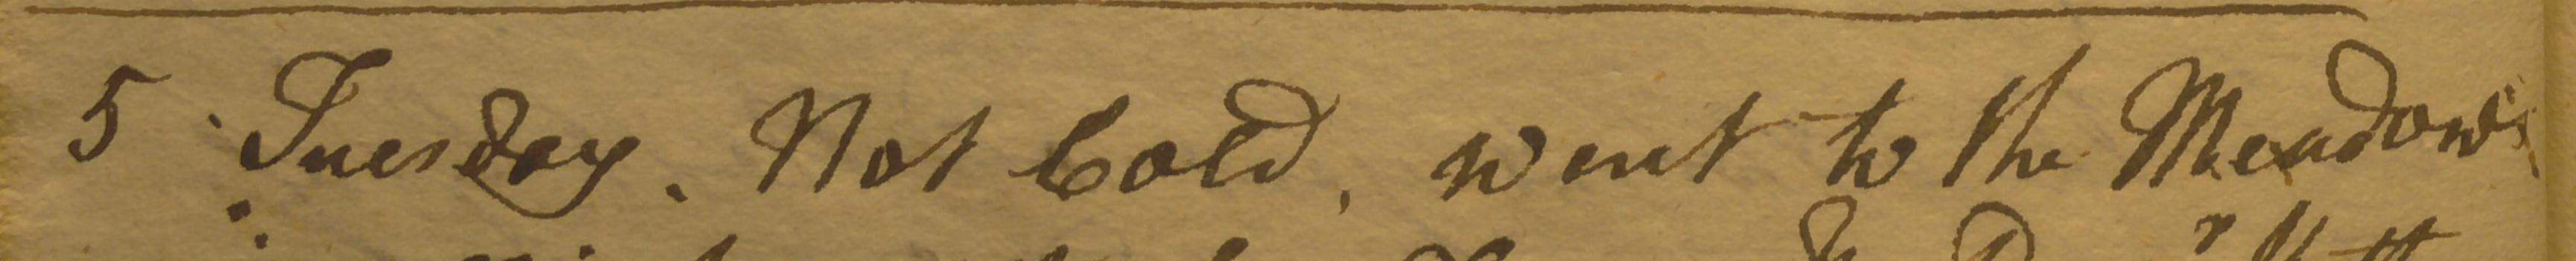5 Tuesday. Not Cold went to the Meadow
